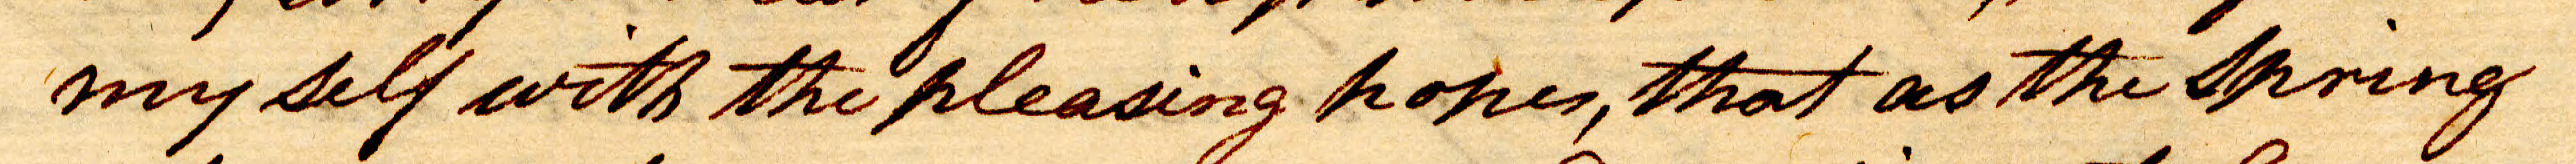myself with the pleasing hopes, that as the Spring
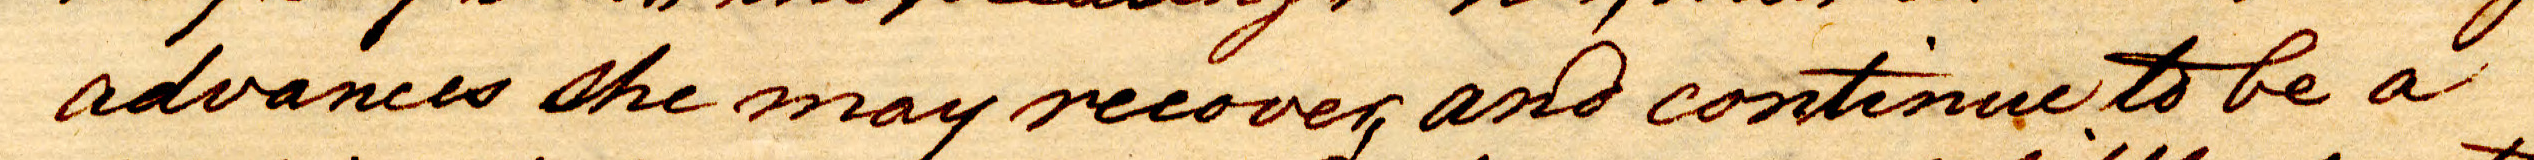advances she may recover, and continue to be a
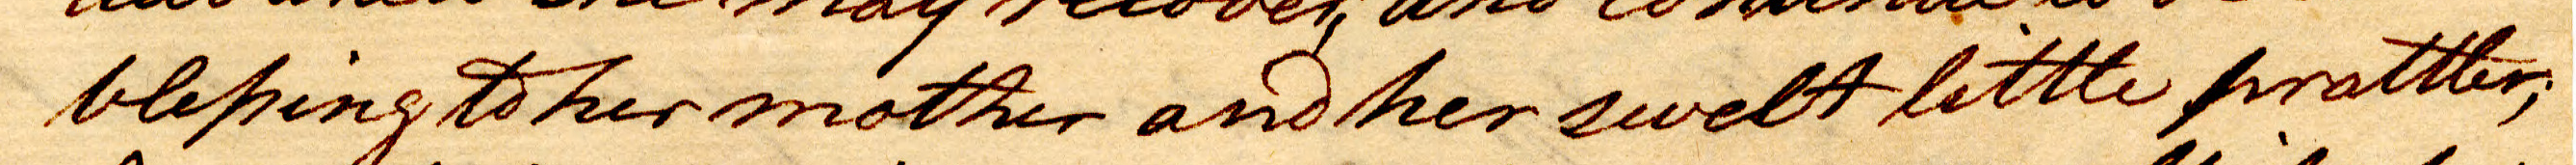blessing to her mother and her swelt little prattler;
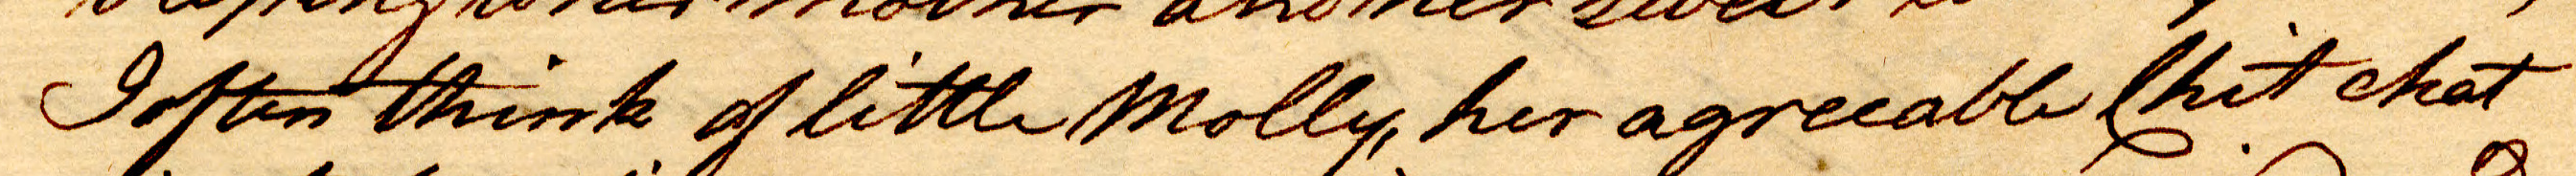I often think of little Molly, her agreeable Chit chat
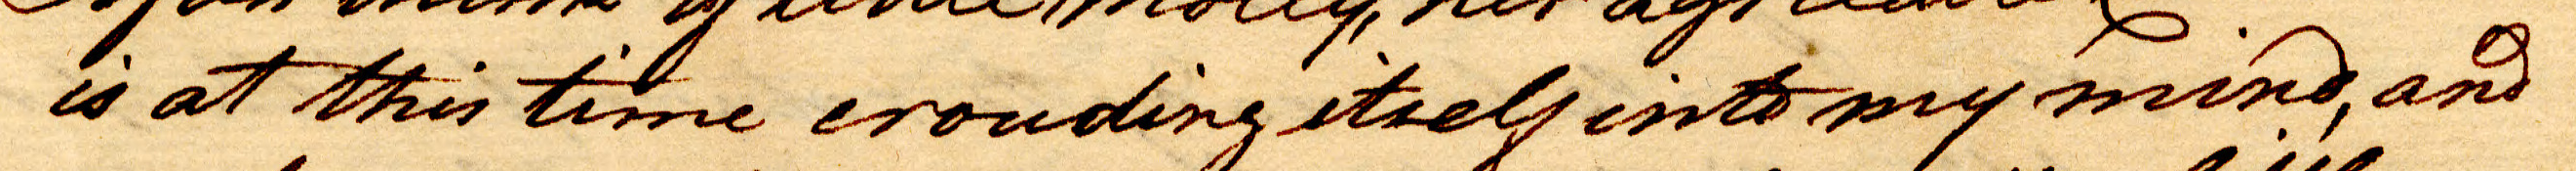is at this time crouding itself into my mind, and
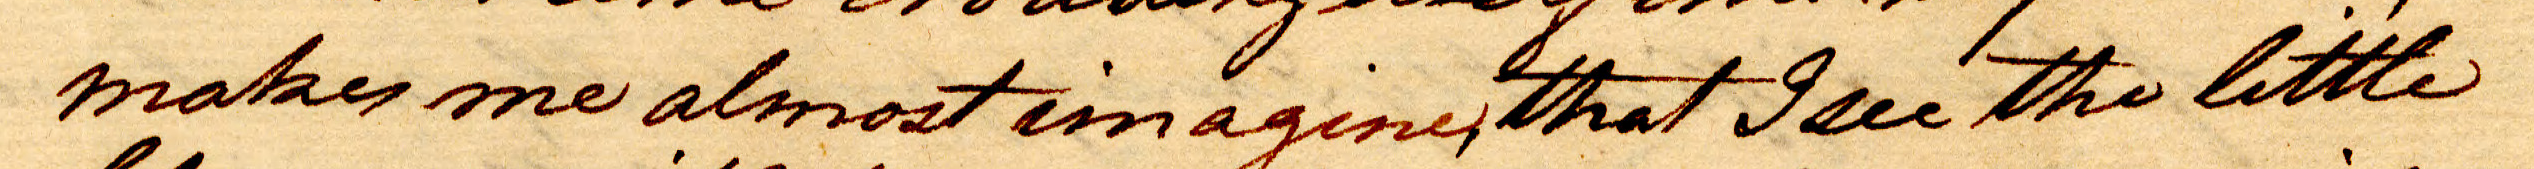makes me almost imagine, that I see the little
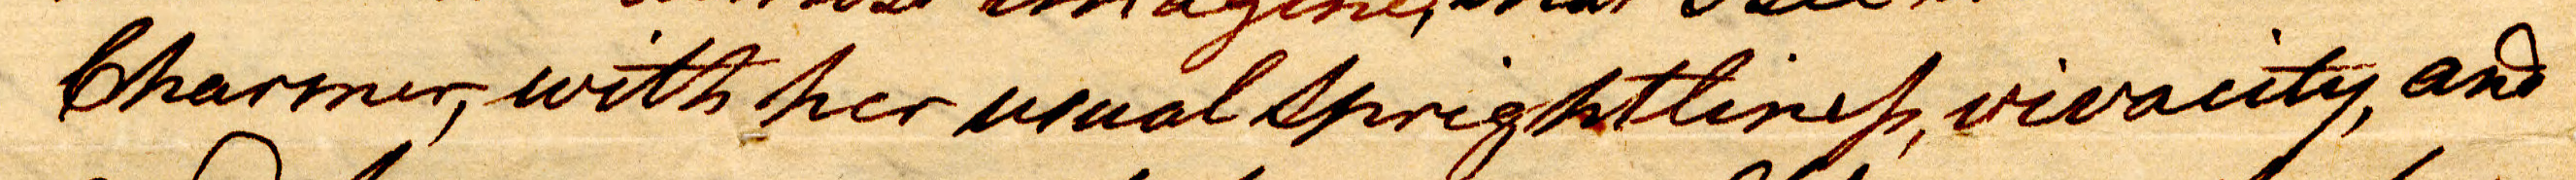Charmer, with her usual sprightliness, vivacity, and
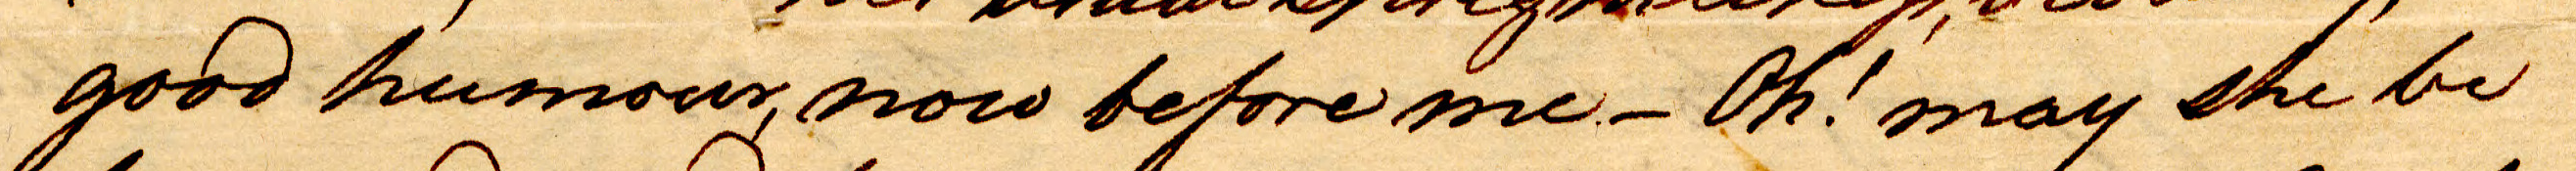good humour, now before me.- Oh! may she be
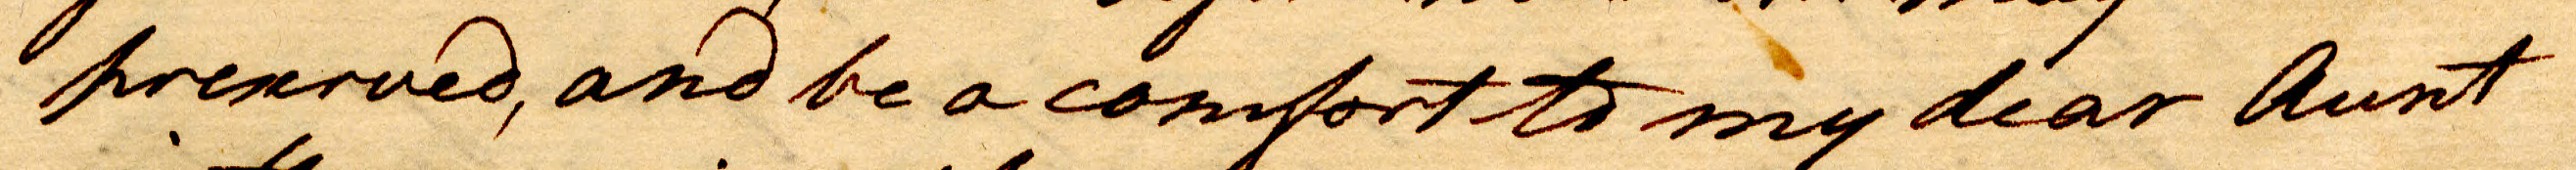preserved, and be a comfort to my dear Aunt
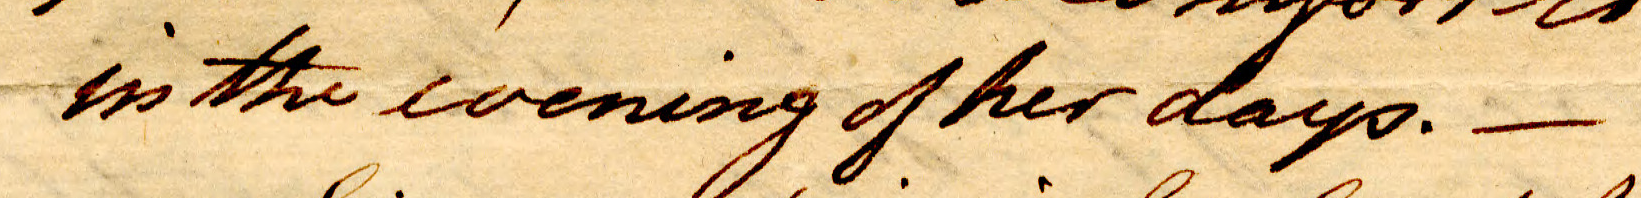in the evening of her days.-
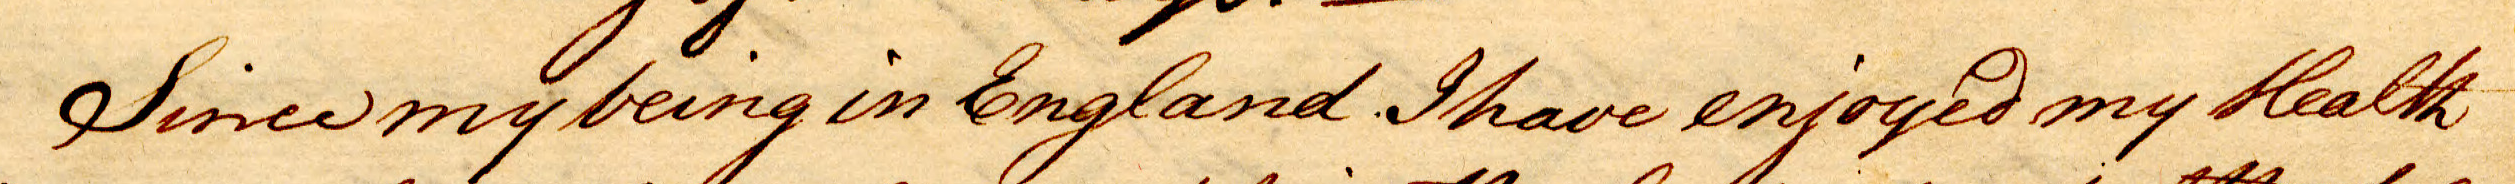Since my being in England I have enjoyed my Health
